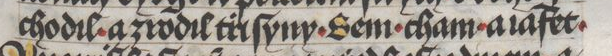chodil.a zrodil tṙi ſyny.Sem.cham.a iafet.
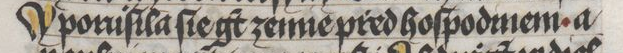Y poruẛila ſie ḡt zemie pṙed hoſpodinem.a
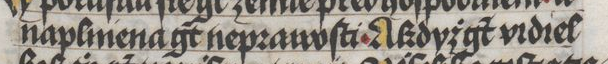naplniena ḡt neprawoſti.Akdyż ḡt vidiel
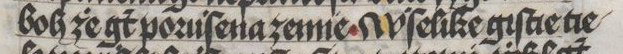boh że ḡt poruẛena zemie.Wẛelike giſtie tie¬
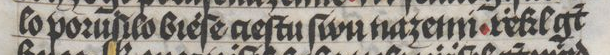lo poruſilo bieẛe cieſtu ſwu nazemi.ṙekl ḡt
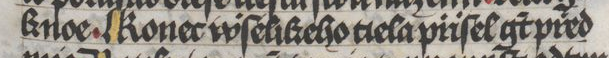knoe.Konec wẛelikeho tiela pṙiẛel ḡt pṙed
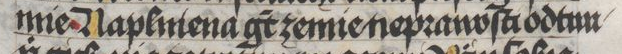mie.Naplníena ḡt zemie neprawoſti odtwa¬
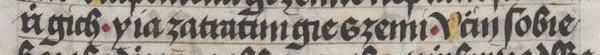ṙi gich.yia zatratim gie szemi.Yċin ſobie
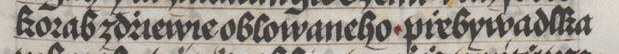kozab zdṙiewie oblowaneho.pṙebywadlka
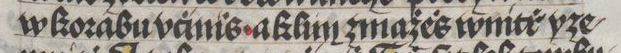w korabu vċiníṡ.a klim zmażeṡ wnítṙ y ze¬
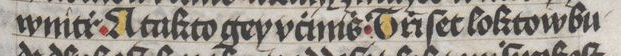wnítṙ. A takto gey vċíníṡ.Tṙiſet loktow bu¬
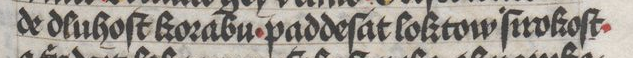de dluhoſt korabu.paddeſat loktow ẛirokoſt.
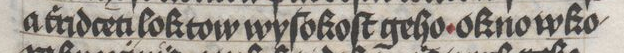a třidceti loktow wyſokoſt geho.okno wko¬
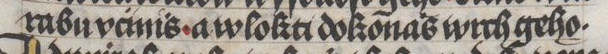rabu vċiníṡ.a wlokti dokonaṡ wrch geho.
